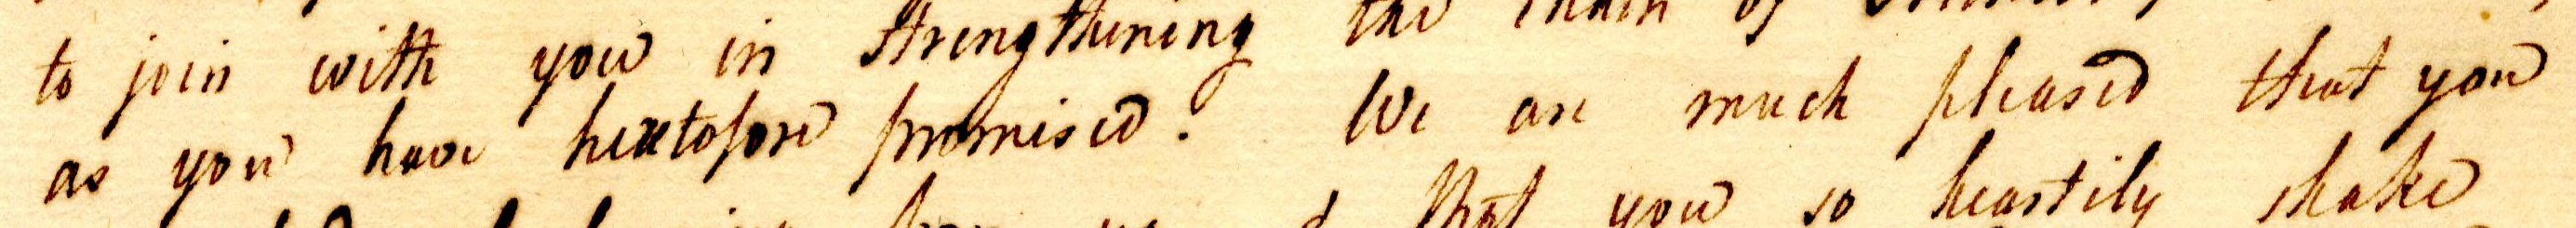as you have heretofore promised. We are much pleased that you
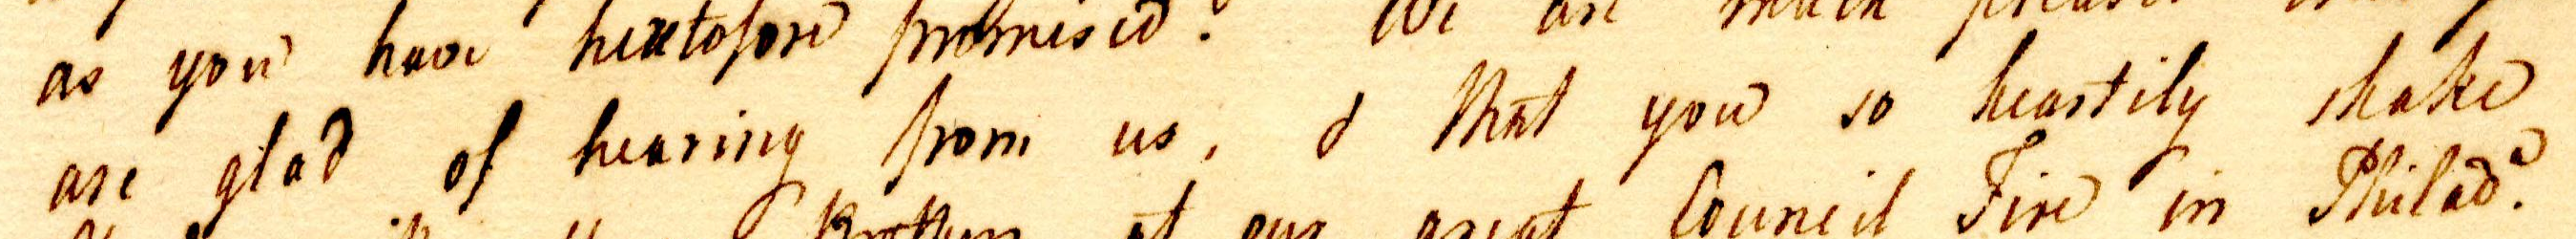are glad of hearing from us, & that you so heartily shake
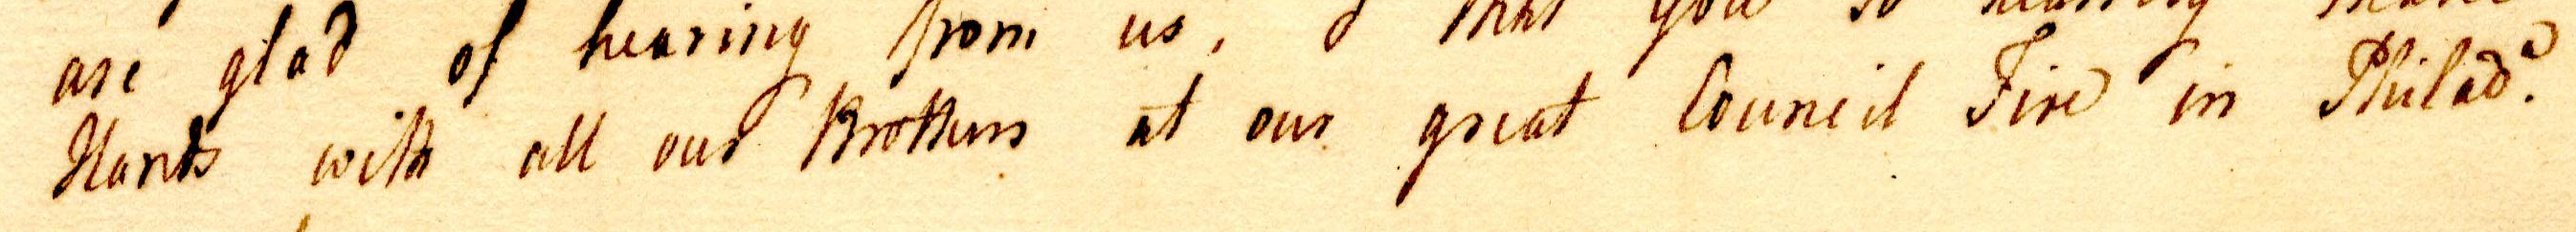Hands with all our Brothers at our great Council Fire in Philad^a.
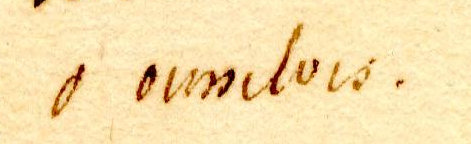& ourselves.
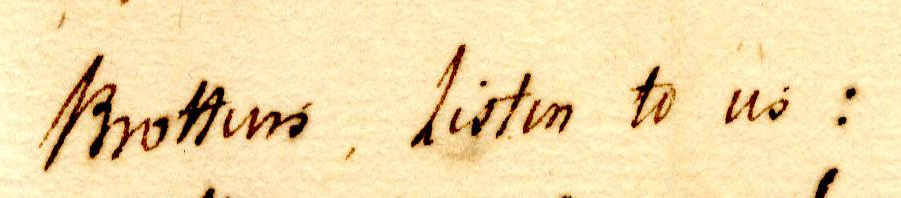Brothers, Listen to us:
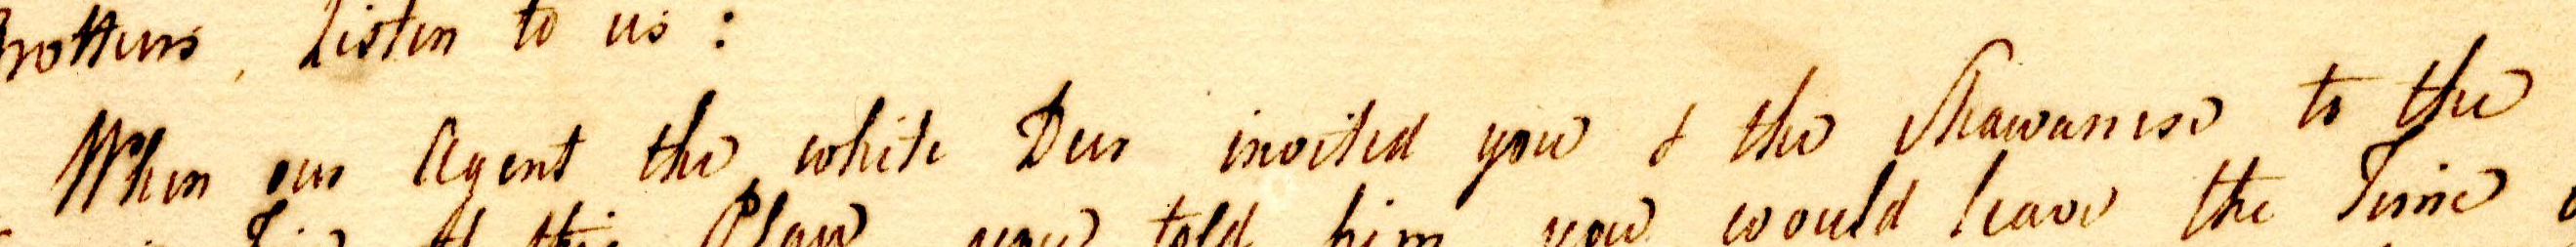When our Agent the white Deer invited you & the Shawanese to the
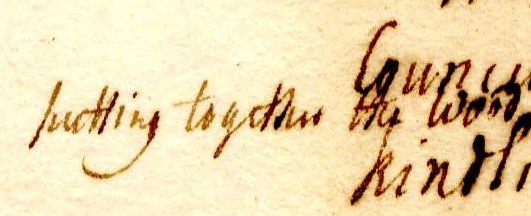putting together the word &
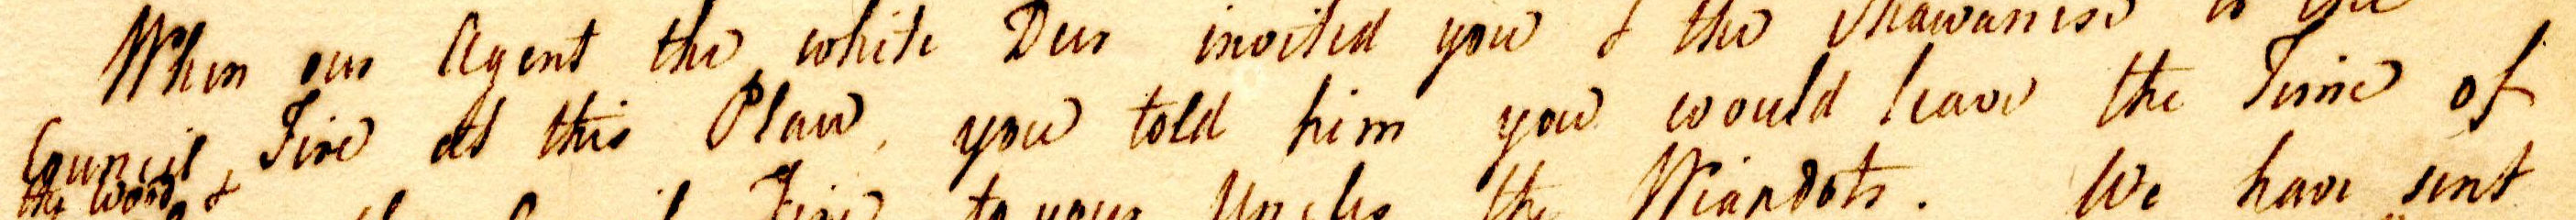Council Fire at this Place, you told him you would leave the Time of
